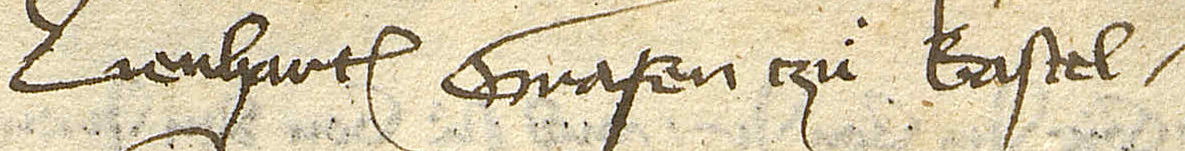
Lienhart* Grafen cʒu Kaſtel /
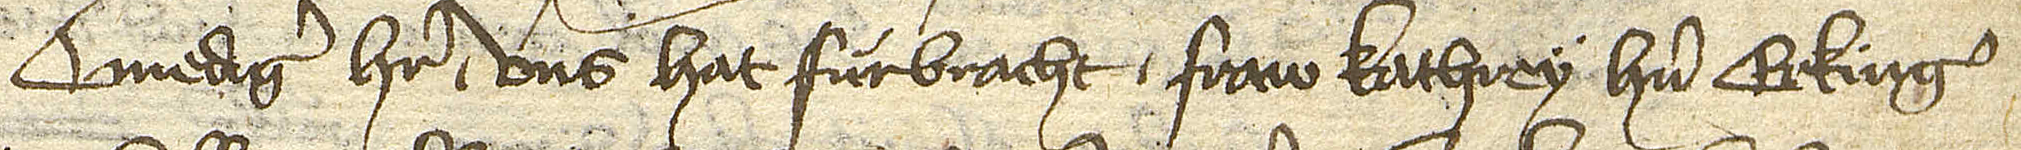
Gnedig* hr* / Vns hat fürbracht / frau Kathrey hn* Erking*
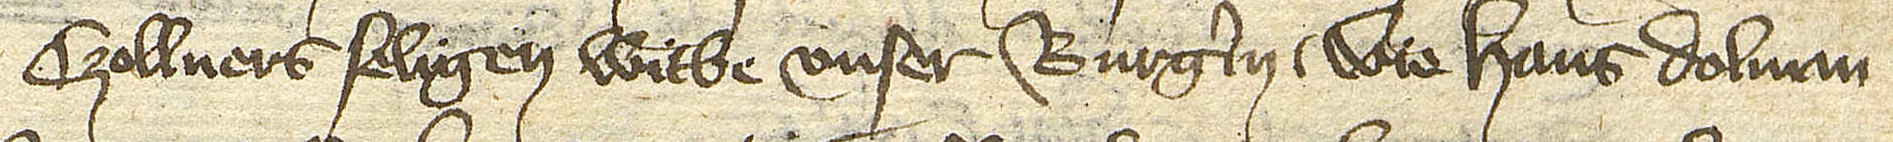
Cʒollners ſeligen witbe vnſer Burg*in / wie hans Dolman
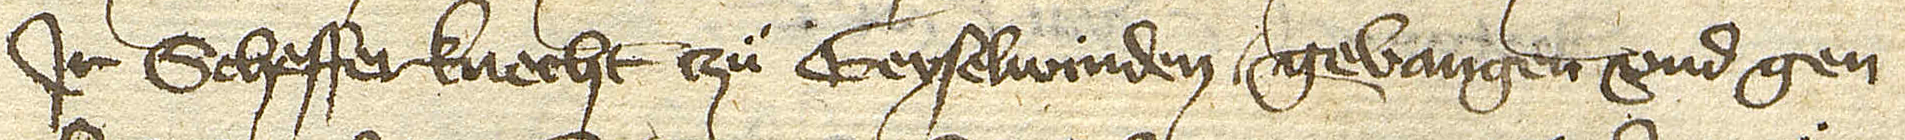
Ir Schefferknecht cʒü Geyſelwinden / gevangen vnd gen
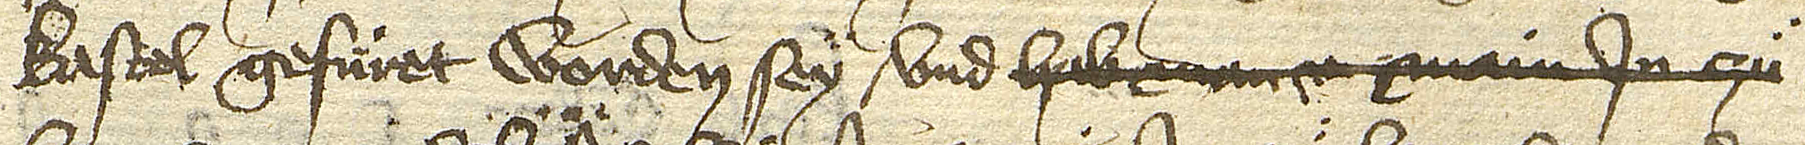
Kaſtel gefüret worden ſey / vnd habe man v main In cʒü
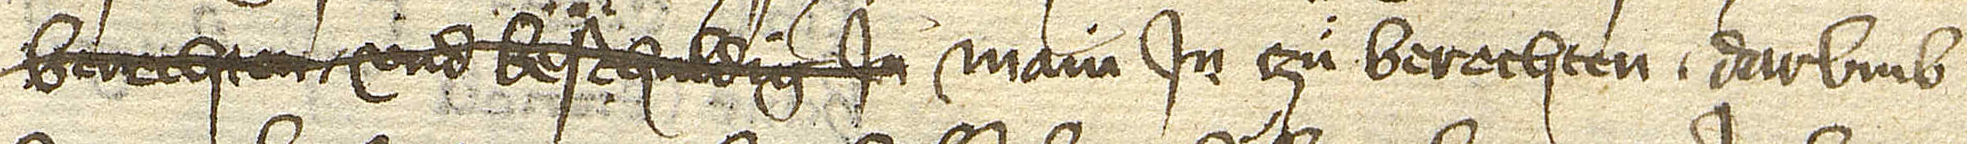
berechten / vnd beſchuldig In main In cʒu berechten . darvmb
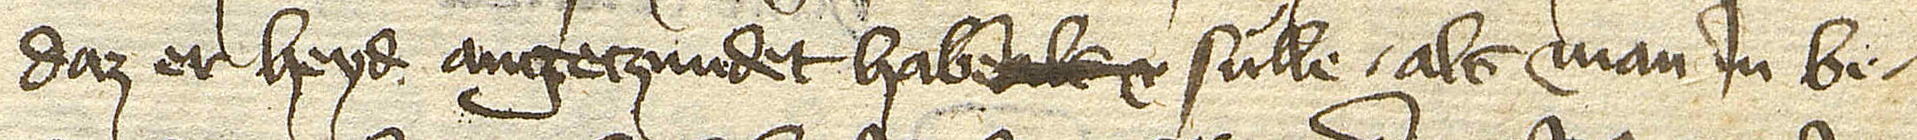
daʒ er heyd angecʒundet habe* als % ſülle / als man In be -
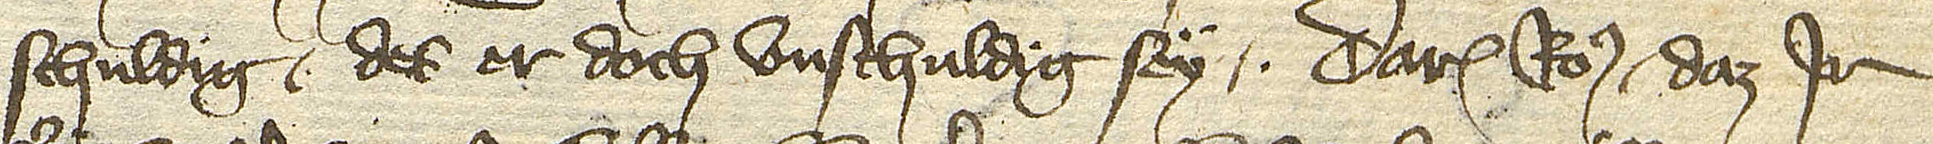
ſchuldig / des er doch vnſchuldig ſey / . Dar* Ro* / daʒ Ir
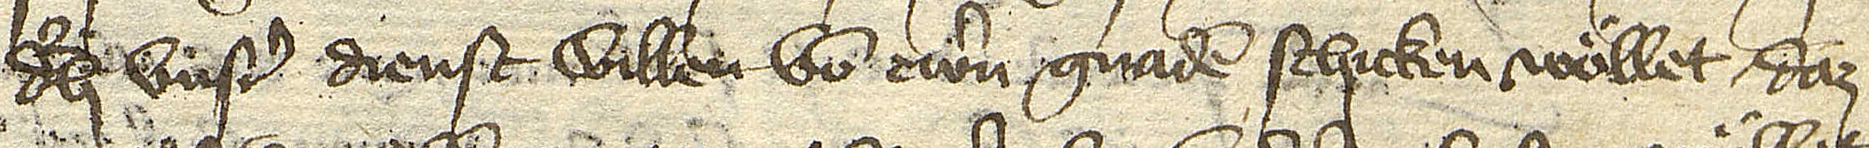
dh* vnſr* dienſt Willen vo* ewn* gnad* ſchicken wöllet / daʒ
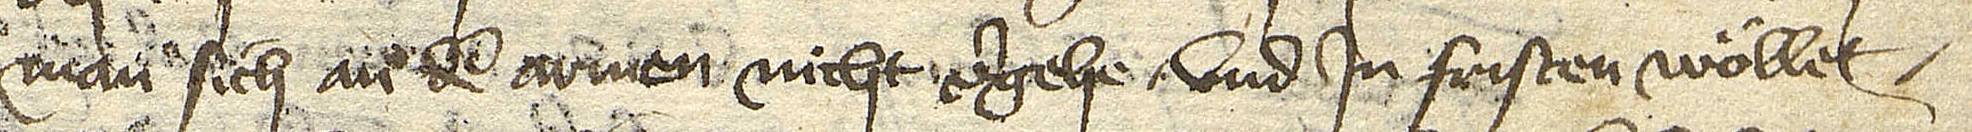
man ſich an d* armen nicht v*gehe / vnd In friſten wöllet /
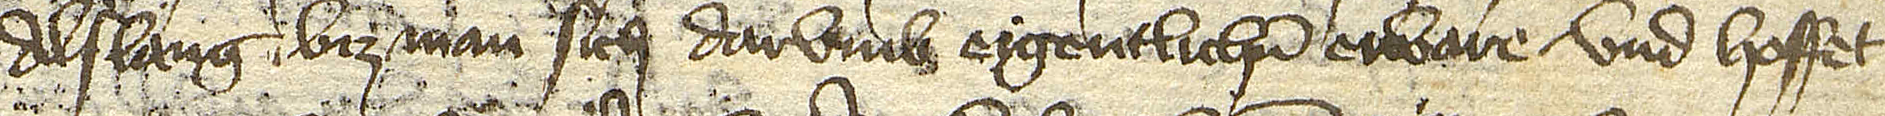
Alſlang / biʒ man ſich darvmb eigentlichn* ervare / vnd hoffet
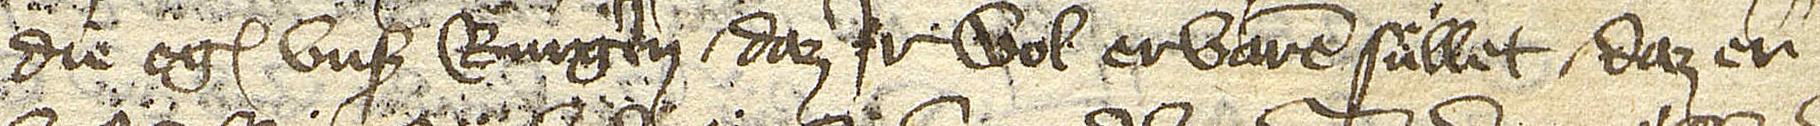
die eg* vnſ* Burg*in / daʒ Ir wol ervare* ſüllet / daʒ er
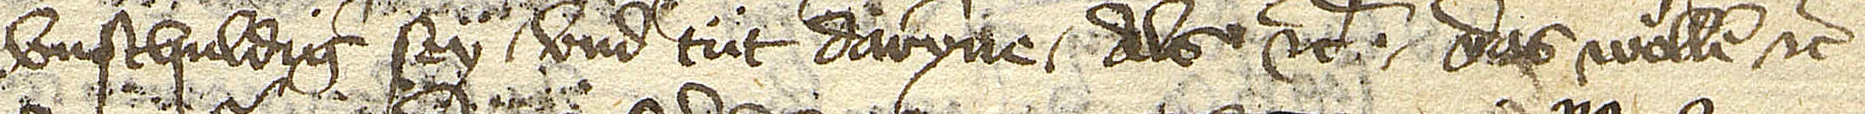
vnſchuldig ſey / vnd tüt daryne* / Als ec* . / Das wölle* ec*
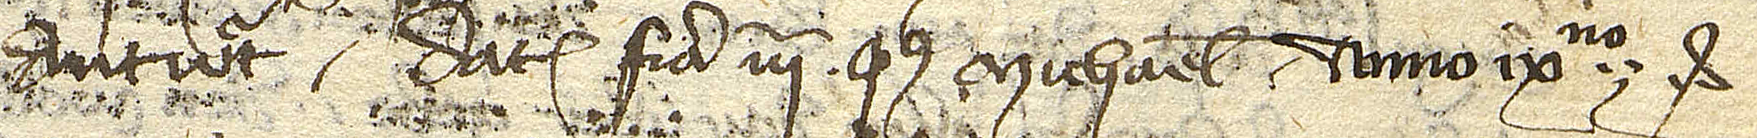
Antwt* / Dat* fia* iii* p* Michael* / Anno ix* % §
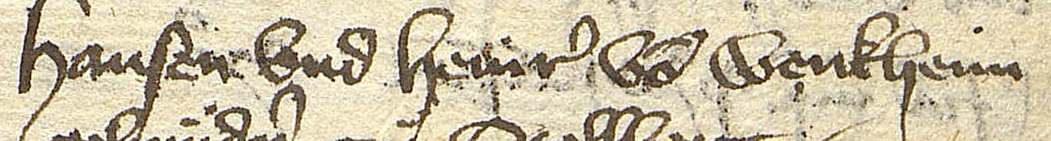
hanſen vnd heinr* vo* wenkheim
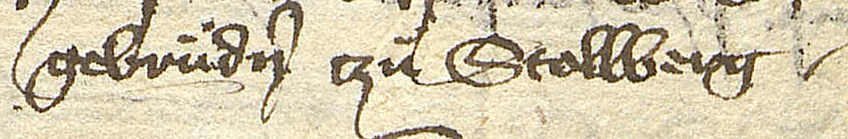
gebrüdn* cʒü Stollberg /
